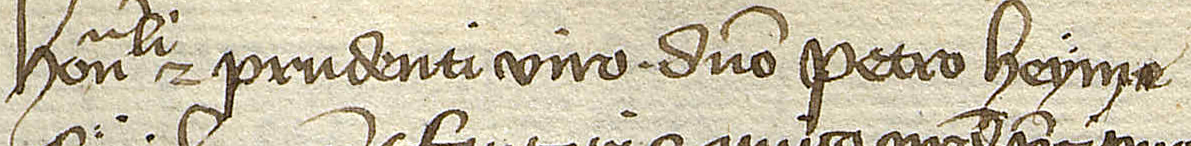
Hon*li @ prudenti viro . d*ne Petro Heyme
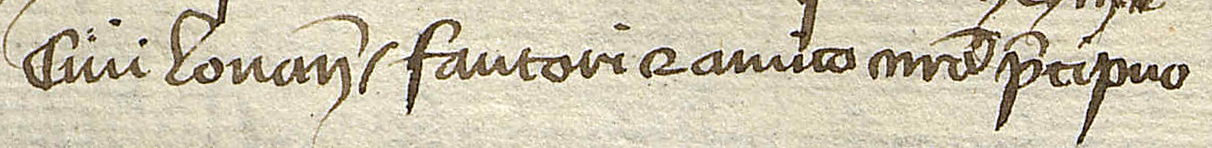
Ciui Louan* / fautori @ amico n*ro p*cipuo
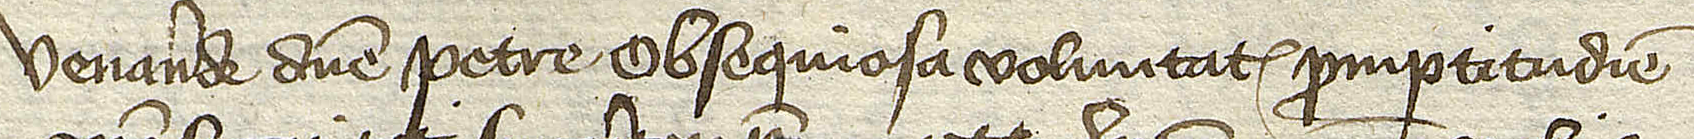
Ven*ande d*ne Petre Obſequioſa voluntat* p*mptitudi*e
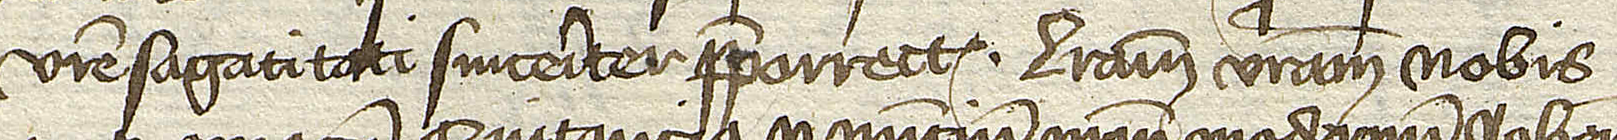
v*re ſagacitati ſince*iter p*porrect* . Lram* v*ram nobis
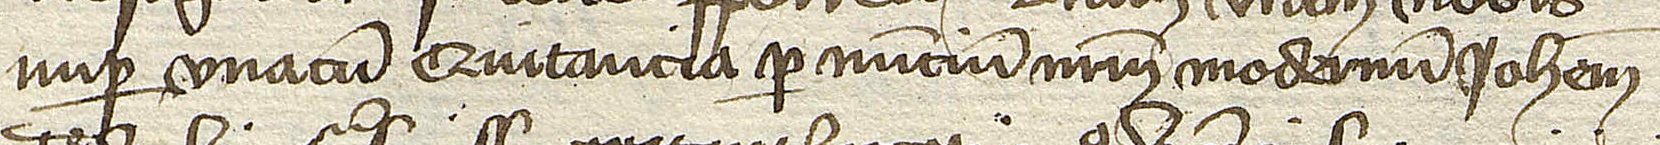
nup* vnacu* Quitancia p* nu*ciu* n*r*m modernu* Ioh*em
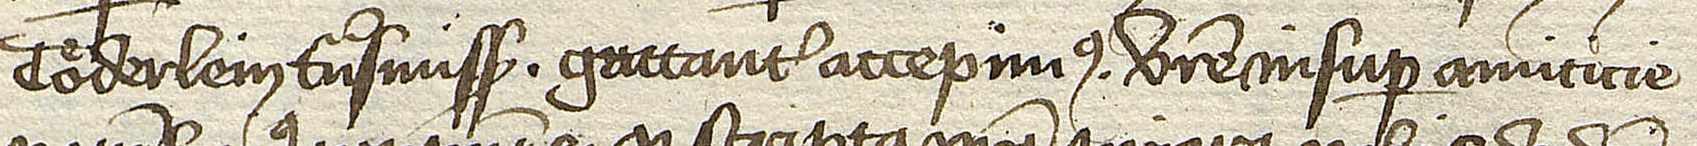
Töderlein t*nſmiſſ* . gattamt* accepim* . V*re inſup* amicicie
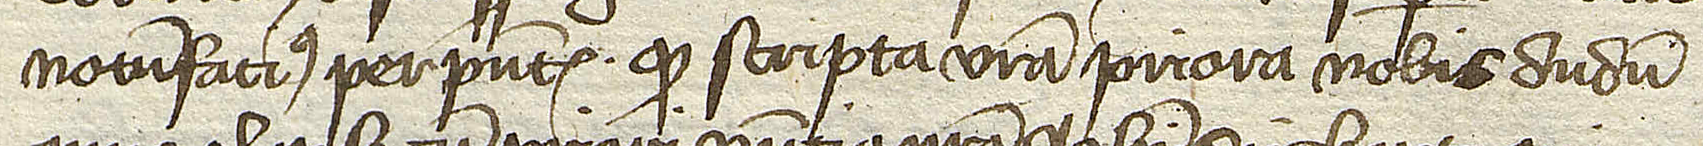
notu*faci* perp*nt* . q* ſcripta v*ra priora nobis dudu*
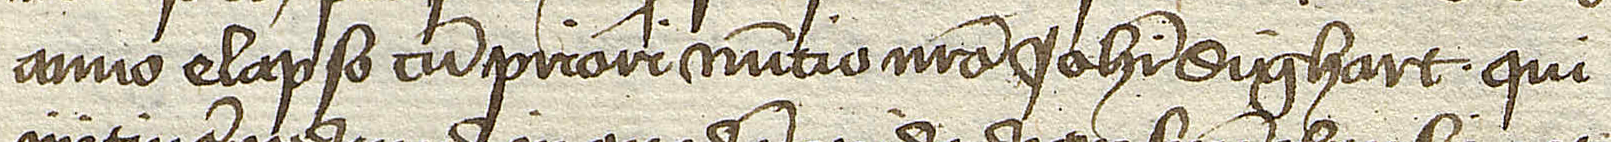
anno elapſo cu* priori nu*cio n*ro Ioh*i Sighart . qui
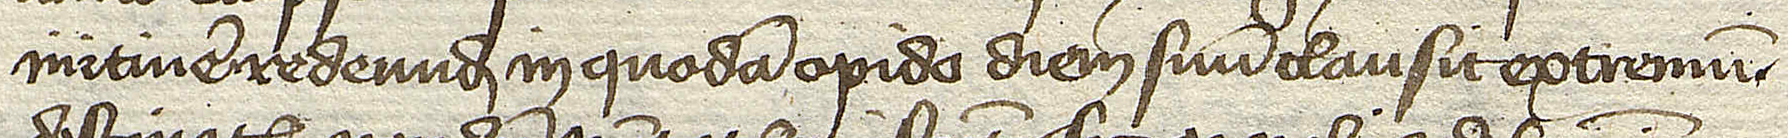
initine* redeund* in quoda* opido diem ſuu* clauſit extremu*
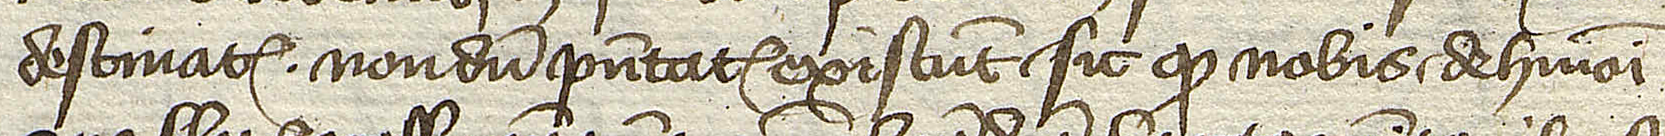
deſtinat* . nondu* p*ntat* exiſtu*t / ſit p* nobis / de hui*o*i
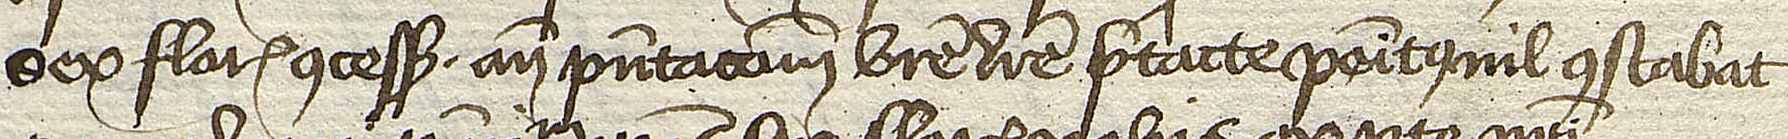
Sex flor* *cess* . an* p*ntac*o*m v*re l*re p*tacte pe*it* nil *ſtabat
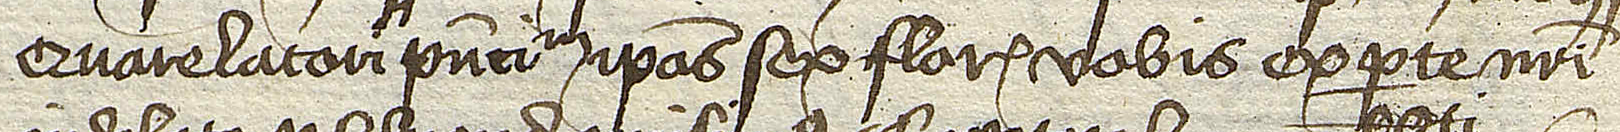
Quare latori p*nci* ip*a ſex flor* vobis ex p*te n*ri
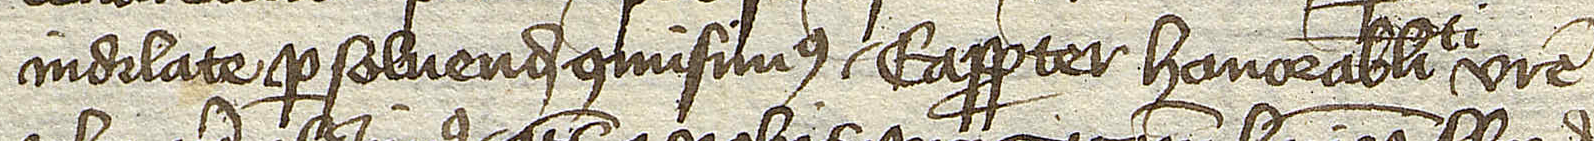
indilate p*ſoluend* *miſim* / Eap*pter honorab*li* v*re
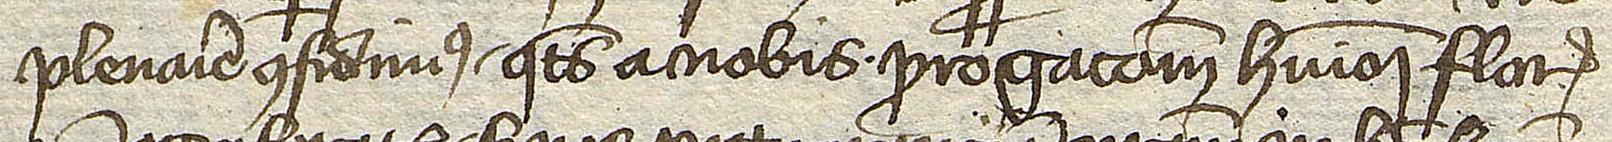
plena*ie *fidim* / q*t*s a nobis p*rogac*o*m hui*o*i flor*
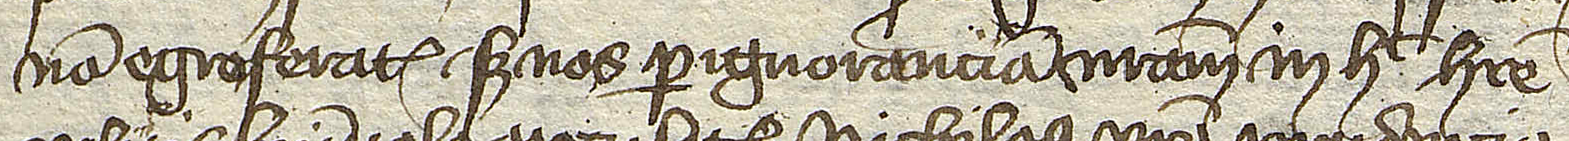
no* egro ferat* / ſ* nos p*ignorancia* n*ram in h* h*re
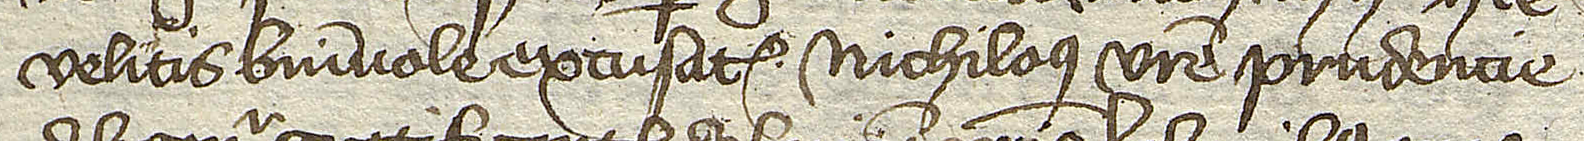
velitis b*niuole excuſat* . Nichilo* v*re prudencie
